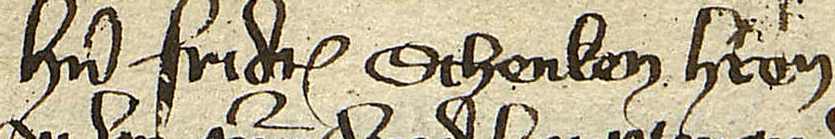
hn* fridr* Schenken h*ren
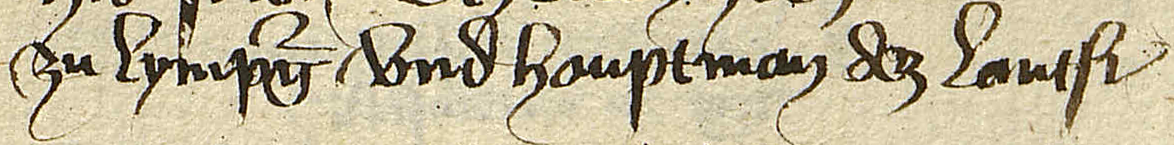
cʒu lymp*g / vnd hauptman deʒ lantfr*
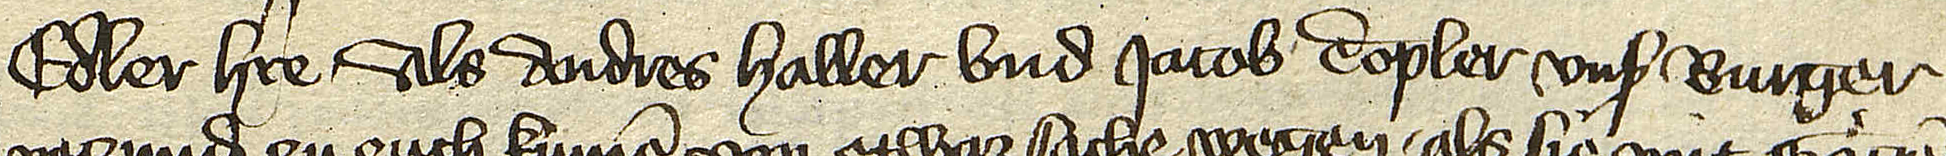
Edler h*re / Als Andres haller vnd Iacob Topler vnſ* Burger
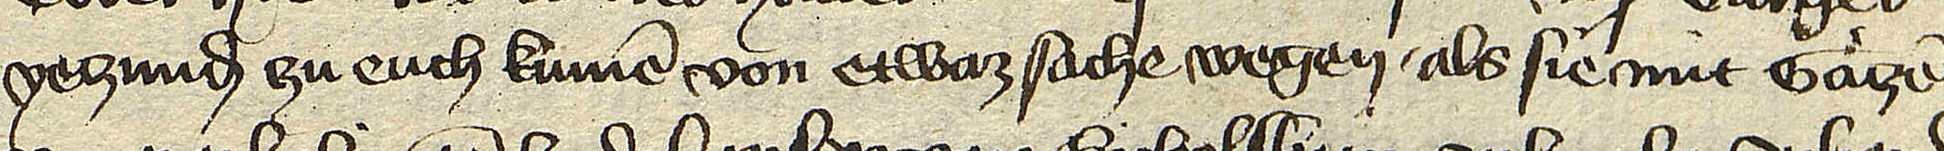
yecʒund* cʒu euch kume* von etwaʒ ſache wegen / als ſie mit Göcʒe*
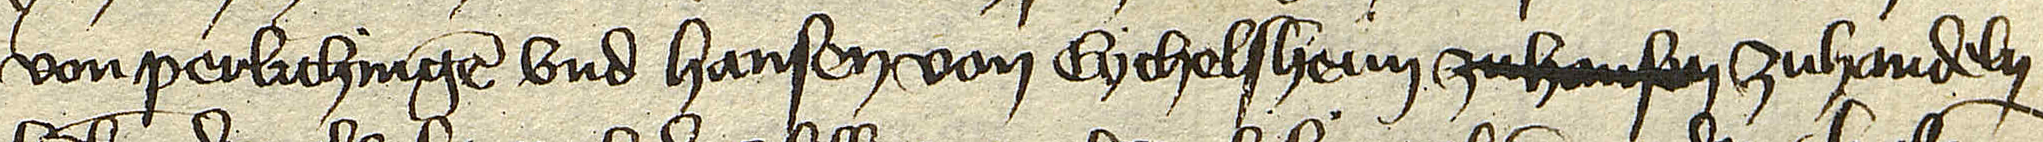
von perlichinge* vnd hanſen von Eychelſheim cʒu hanſen cʒu handeln
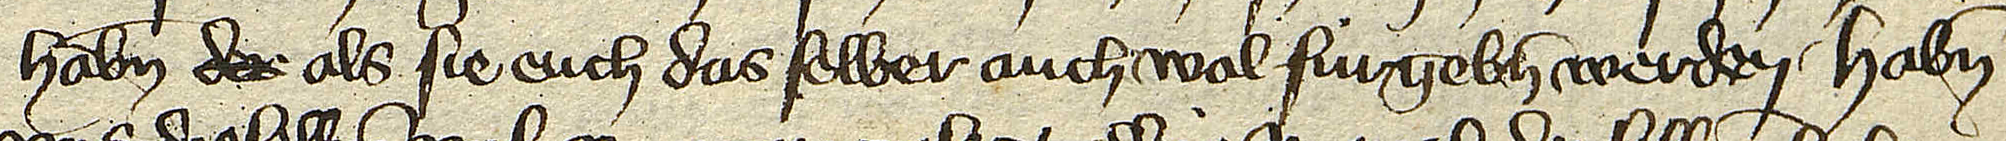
habn* der als ſie euch das ſelber auch wol fürgebn* werden / habn*
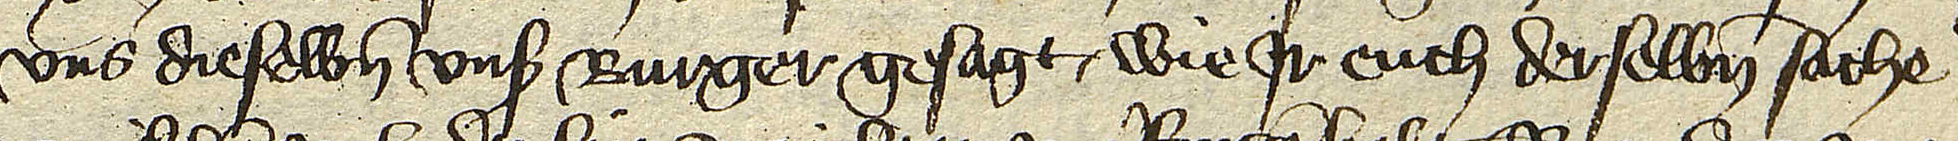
vns dieſelbn* vnſ* Burger geſagt / wie Ir euch derſelbn* ſache
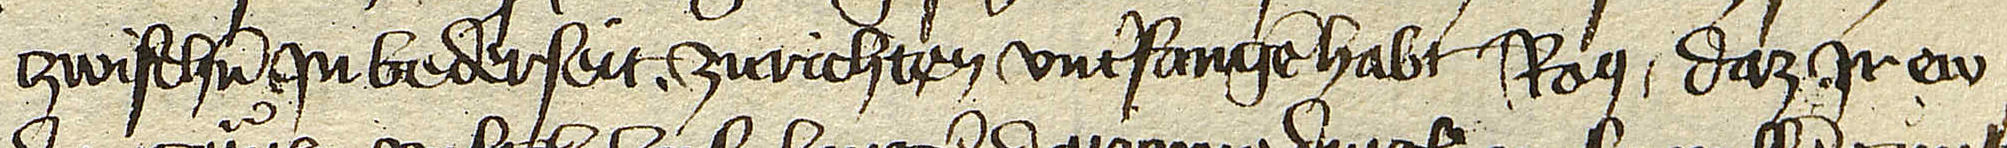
cʒwiſchn* In bederſeit . cʒurichten vntfange* habt Ro* / daʒ Ir ew
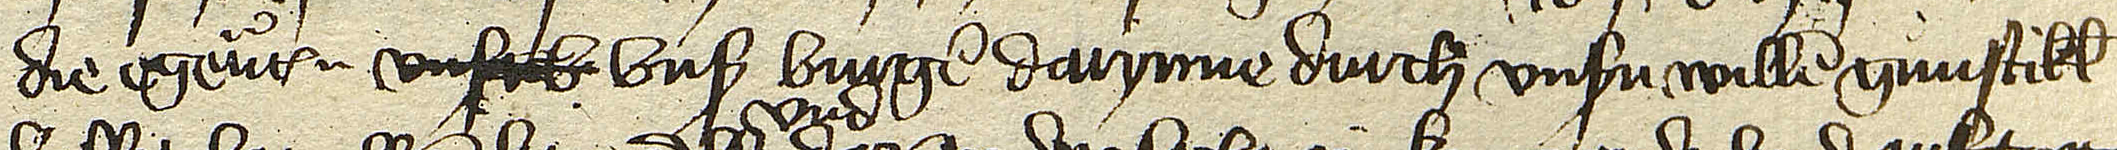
die egen*t* ~ vnſnb vnſ* burge* darynne durch vnſ*n wille* günſtikl*
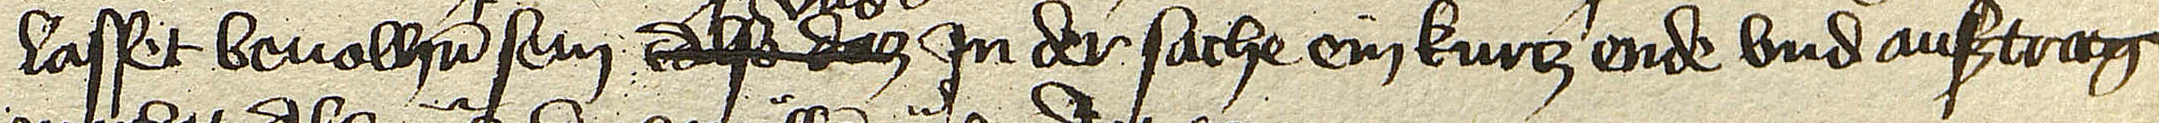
laſſet beuolhn* ſein / Alſo daʒ In der ſache ein kurcʒ ende vnd auſʒtrag
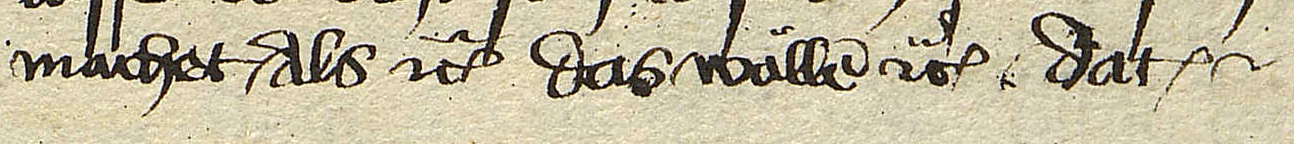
machet / Als ec* das wölle ec* / dat* ~
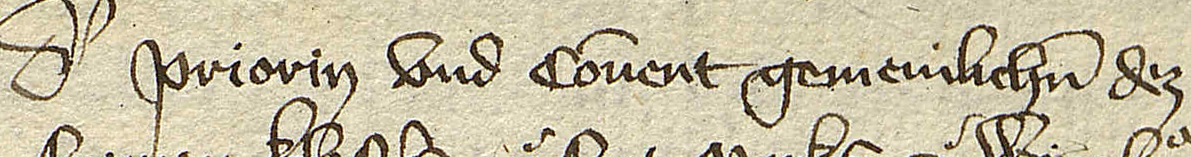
D* priorin vnd Co*uent gemeinlichn* deʒ
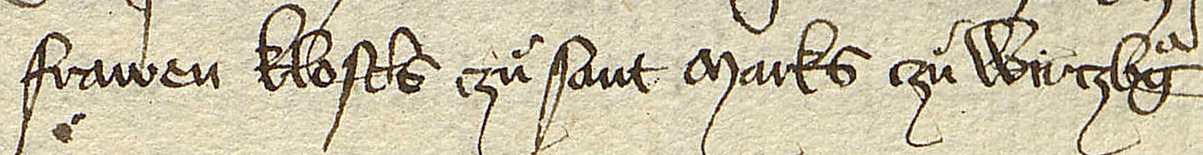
frawen kloſt*s cʒü ſant Marks cʒü Wircʒb*g
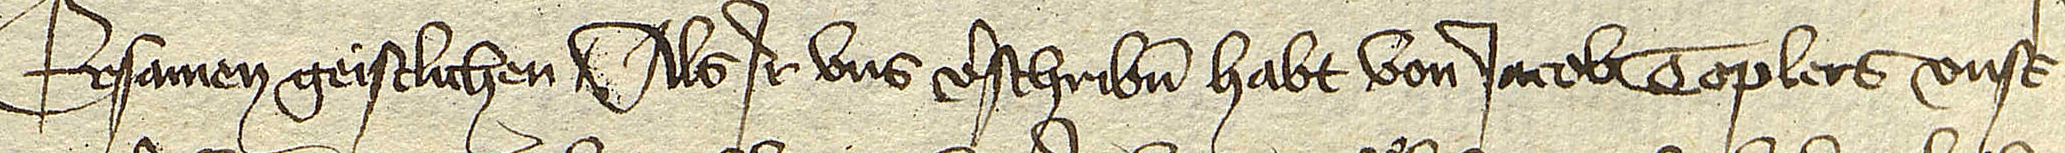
Erſamen geiſtlichen / Als Ir vns v*ſchribn* habt von Iacob Toplers vnſ*s
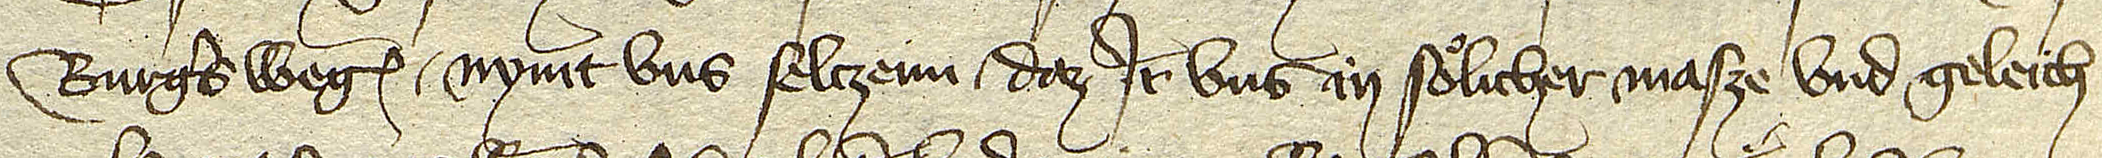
Burg*s weg* / nymt vns ſelcʒeim / daʒ Ir vns in ſölicher maſʒe vnd geleich
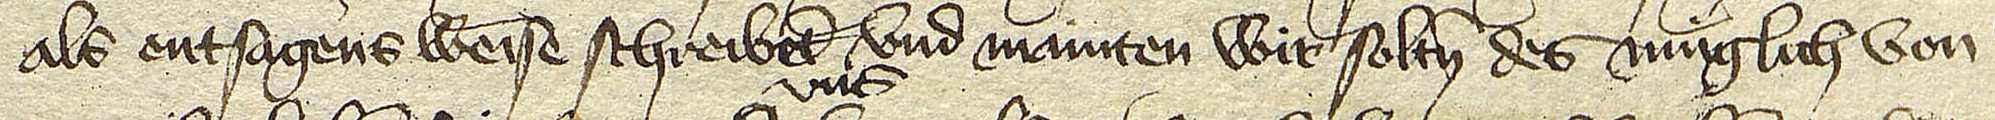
als entſagens weiſe ſchreibet / vnd mainten wir ſoltn* des müglich von
